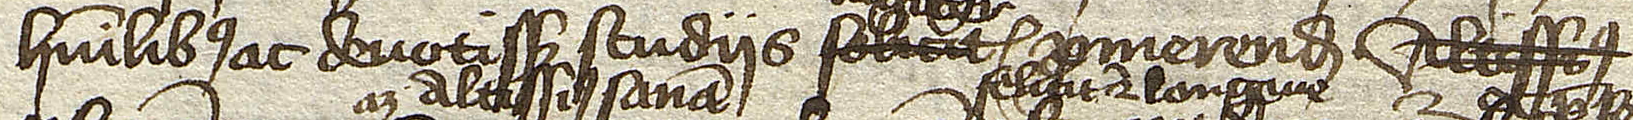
hu*ilib* ac deuotiſſ* ſtudiis ſolicit* iugiter p*merend* Altiſſi*
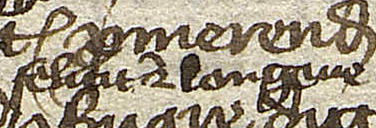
felicit* @ longeue
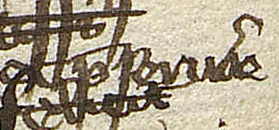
p*ſerua*e
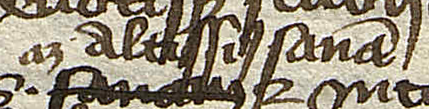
Altiſſi* ſana*
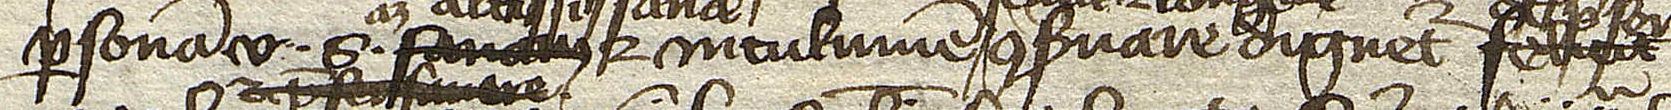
p*ſona* v . S . ſanam @ incolume* *ſ*uare dignet* felicit*
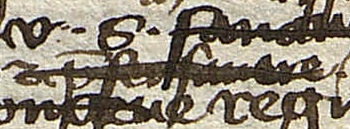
@ p*ſerſauere
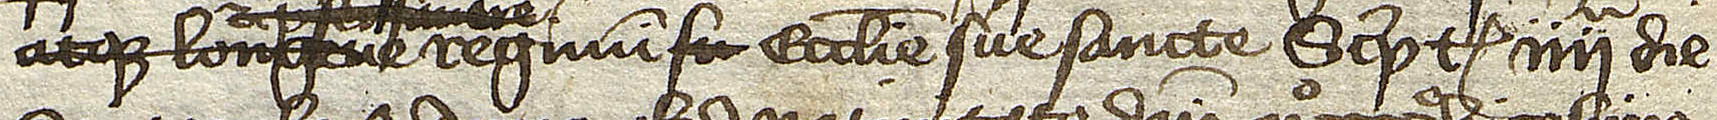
atq* longeue regimi* ſu Eccl*ie ſue ſancte Sc*pt* iiii* die
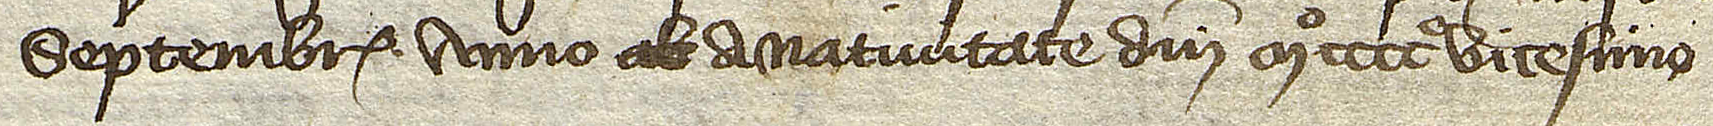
Septembr* . Anno ab A Natiuitate d*ni M*cccc* viceſimo
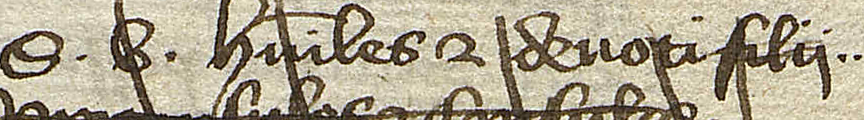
S . v . huiles* @ deuoti filii ~
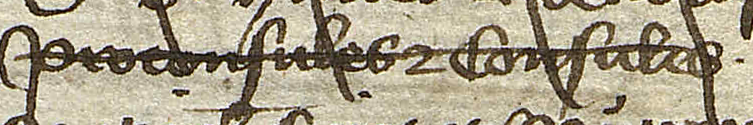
Proconſules @ Conſules .
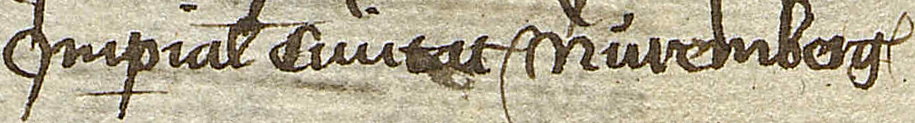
Imp*ial* Ciuit* Nüremb*g*
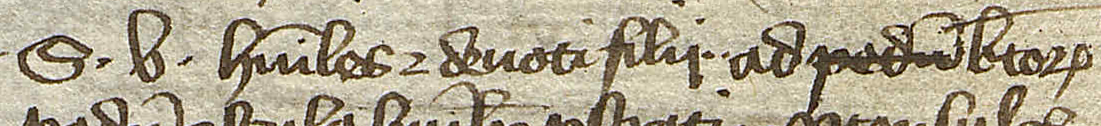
S . v . huiles* @ deuoti filii ~ ad pedu* b*t*o*
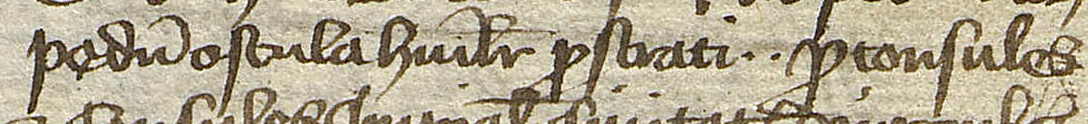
pedu* oſcula hu*il*r p*ſorati p*conſu*les
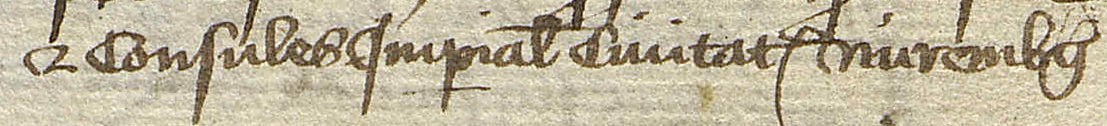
@ Conſules Imp*ial* Ciuit* Nüremb*g*
